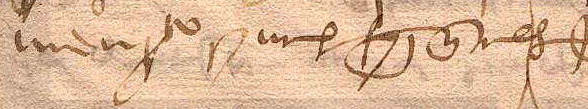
meu ꝓco sjnal fjz q̄ tal he
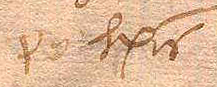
pg Lx rs̄
